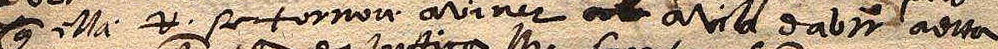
q̄ ella R se tornou a viuer __ a vila davrro a dita
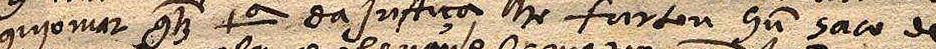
gujomar ḡlz ta da Justiça lhe furtou hū saco de
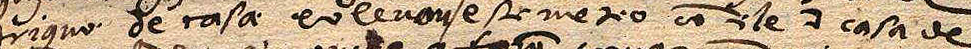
triguo de casa e o leuou / e se meteo c̄o ele ē casa de
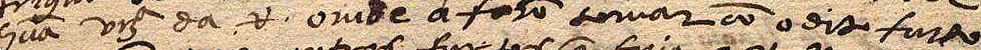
hūa viza da R omde a forō tomar c̄o o dito furto
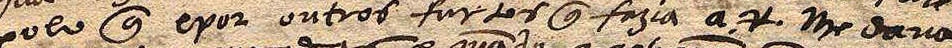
polo q̄ e por outros furtos q̄ fazia a R lhe daua
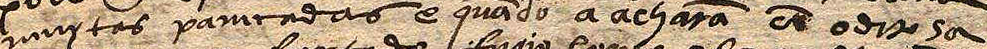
muytas pamcadas e qūado a achar̄a c̄o o dito sa
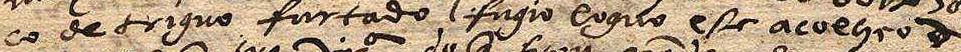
co de triguo furtado fugio loguo e se acolheo ē
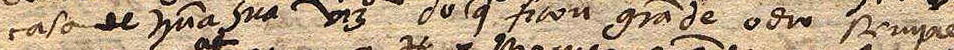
casa de hūa sua viza do q̄ ficou grāde odio sempre
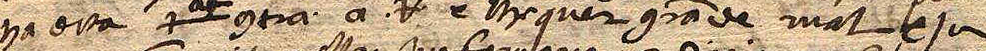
ha dita tas ꝯtra a R e lhe quer grāde maL e Ju
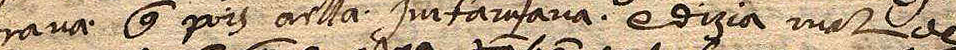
raua q̄ pois a ella Jmfamaua e dizia maL de
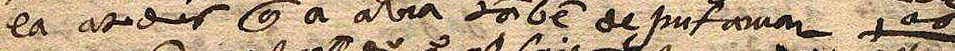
la a todos q̄ a via tābē de Jmfamar tas
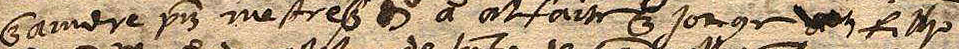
item amdre pīz mestre item djo ao alfaite item Jorge vaz filho
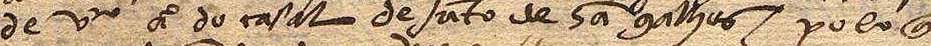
de vco ao do casaL de Jūto de sāgalhos / polo q̄
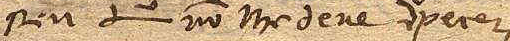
seu to n̄o lhe deue ēpecer //
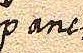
po anes
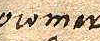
giomar
